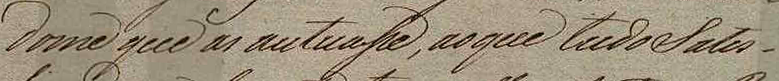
dome que as autuasse, ao que tudo sates
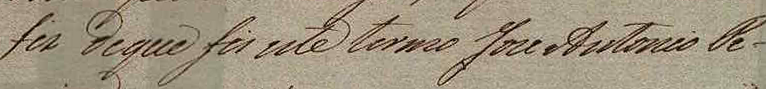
fiz de que fis este termo Joze Antonio Pe
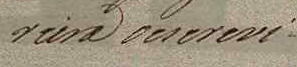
reira o escrevi
